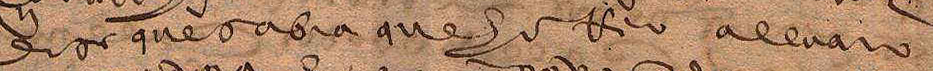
dise que sabia que ho Reo alluaro
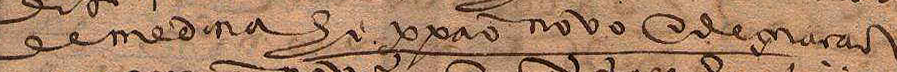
de medina he xpaõ novo e de geracaõ
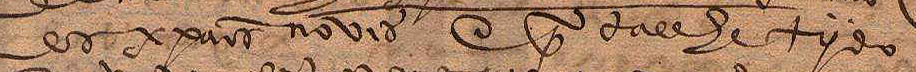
dos xpaõs novis e p̄o tall he tydo
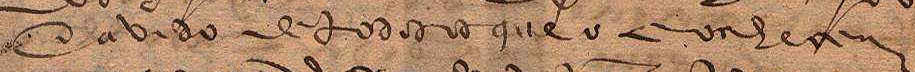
e avido de todos os que o conhecem
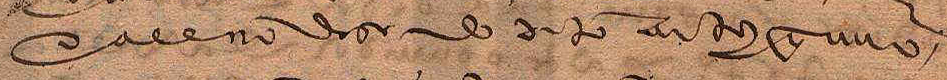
e all nō dise do dito artyguuo/
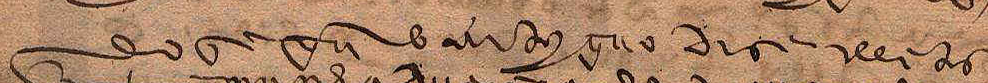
item do segūdo artyguo dise elle tes
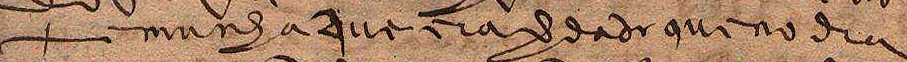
temunha que era ꝟdade que no dia
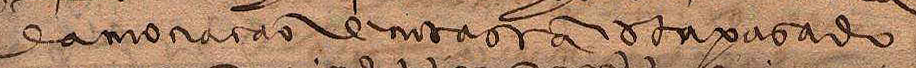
danūciacaõ de nosa srā esta pasado
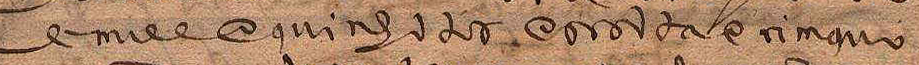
de mill e quinhētos e sese̅ta e cimquo
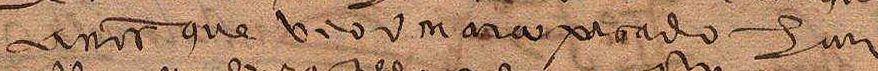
anōs que veo ē marco pasado hum
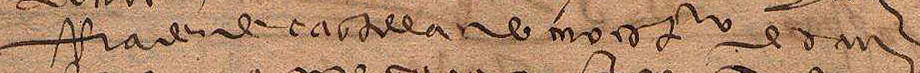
ffrade de castella do moestro de sam
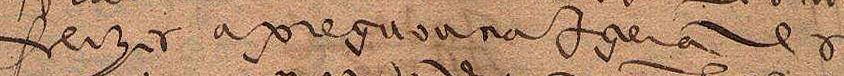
felizes apreguou na Jgreia des
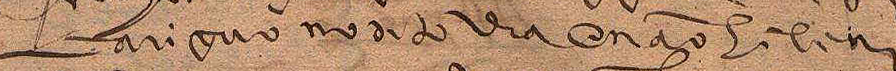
Cariguo no dito dia e não he lem
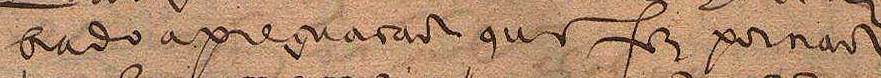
brado a preguacaõ que fez por naõ
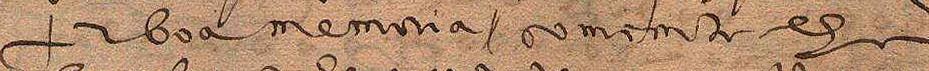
ter boa memoria / somemte lhe
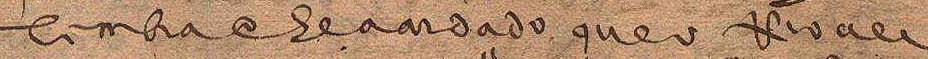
lembra e he acordado que o Reo all
